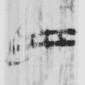母
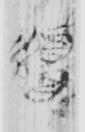弼
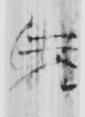𡚦
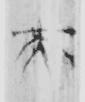夫
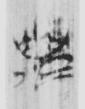若
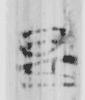是
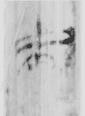民
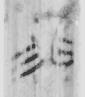非
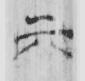亓
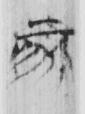所
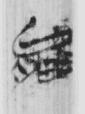能
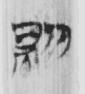則
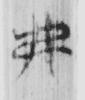弗
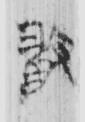敢
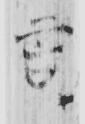言
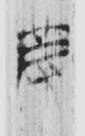皮
